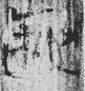恥
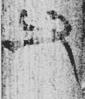父
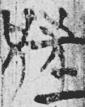○（兄）
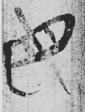母
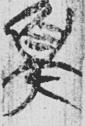○（憂）
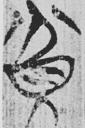貧
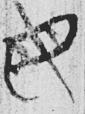母
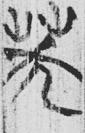○（笑）
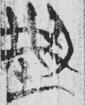型（刑）
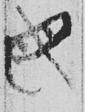母
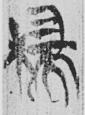椯（揣）
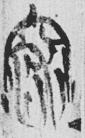深
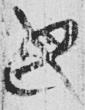母
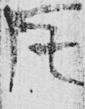厇（度）
